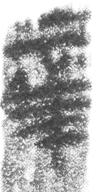帝
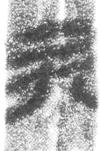而
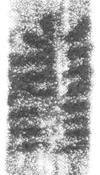事
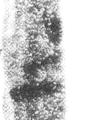之
